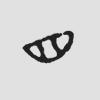四
